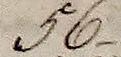56
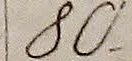80
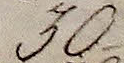30
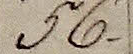56
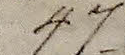47
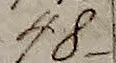48
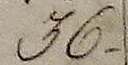36
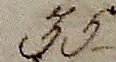35
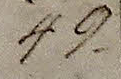49
